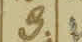3.
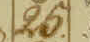25.
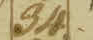34
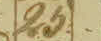25.
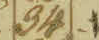34
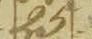25
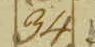34
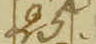25
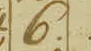6.
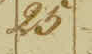25
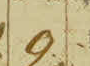9.
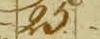25.
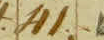41.
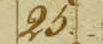25.
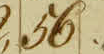56
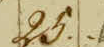25.
